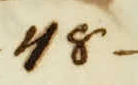48
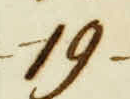19
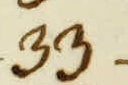33
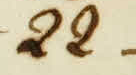22
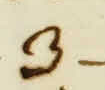3
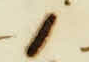1
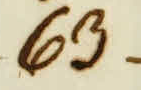63
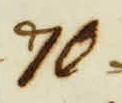70
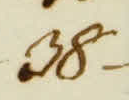71
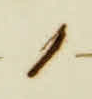1
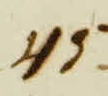45
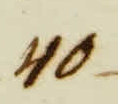40
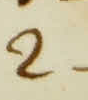2
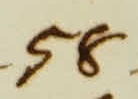58
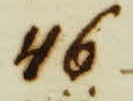46
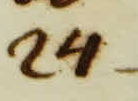24
